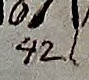42
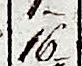16
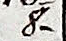8
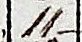11
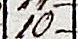10
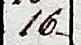16
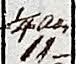11
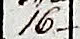16
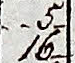16
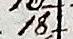18
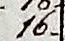16
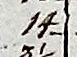14
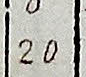20
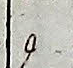9
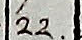22
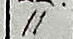11
